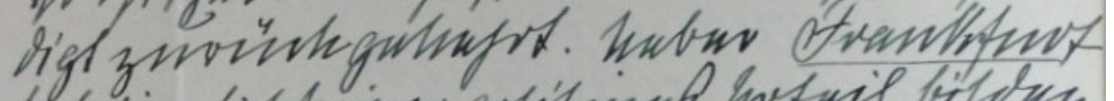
digt zurück gekehrt. Über Franfurt
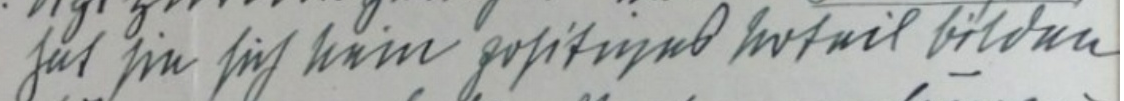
hat sie sich kein positives Urteil bilden
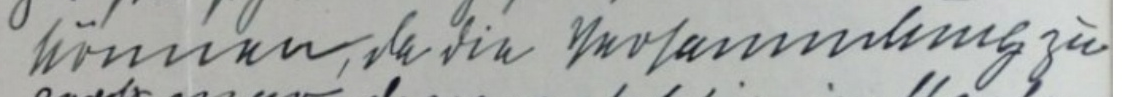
könnenm die die Versammlung zu
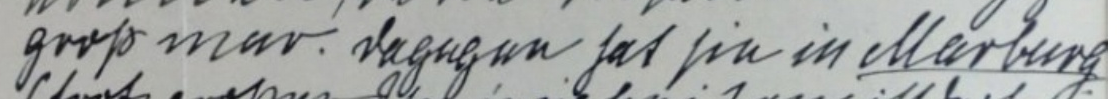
groß war. Dagegen hat sin in Marburg
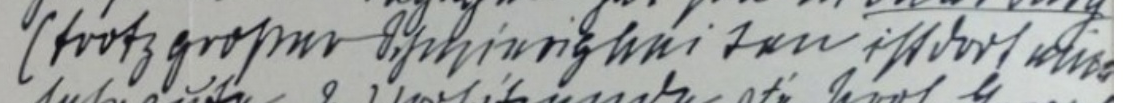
(trotz großer Schwierigkeiten ist dort eine
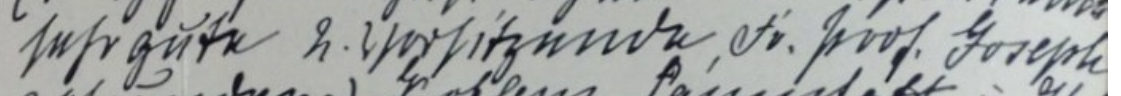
sehr gute 2. Vorsitzende, Fr. Prof. Joseph
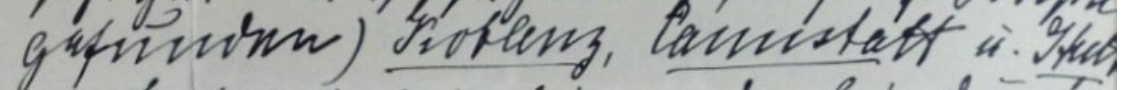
gefunden. Koblenz, Cannstatt u. Stutt
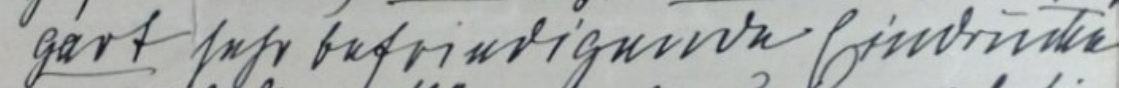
gart sehr befriedigende Eindrücke gehabt.
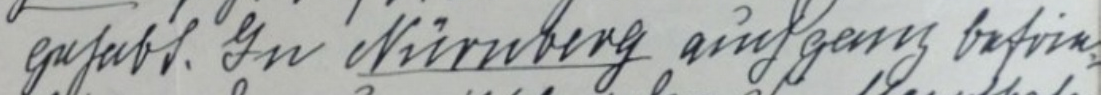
In Nürnberg auch ganz befrie
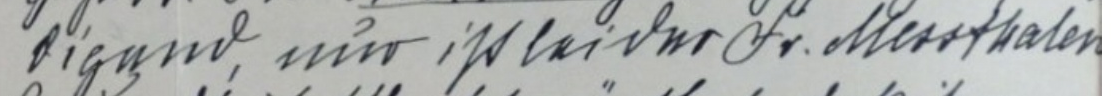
digend, nur ist leider Fr. Messthaler
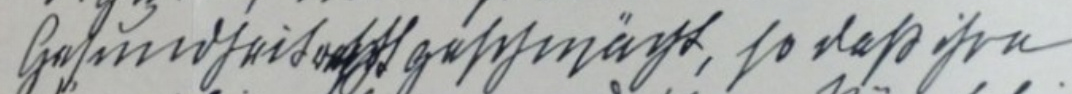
Gesundheitlich geschwächt, so da0 ihre
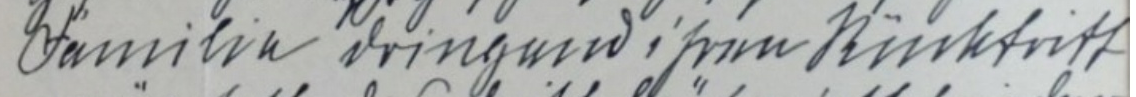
Falimilie dringend ihren Rücktritt
